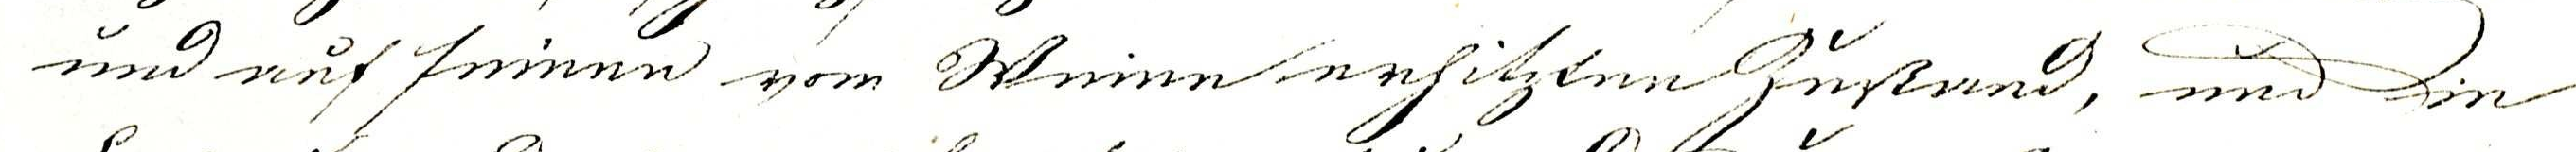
und auf seinen vom Weine erhitzten Zustand, und die
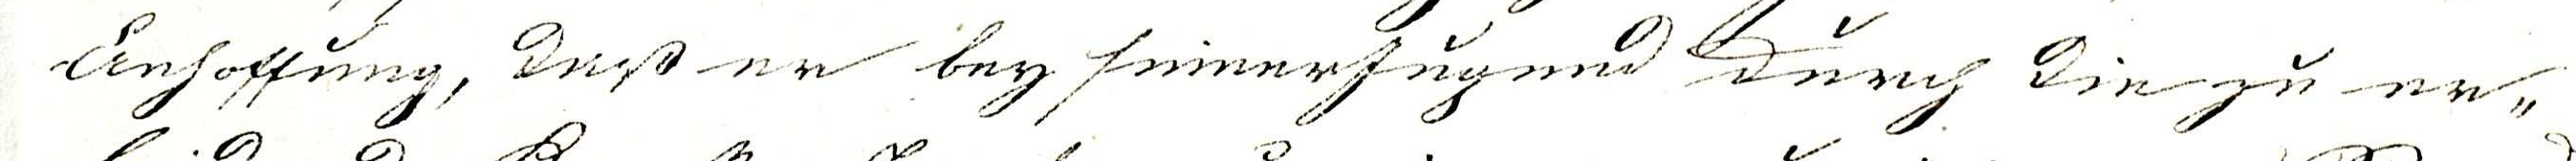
Anhoffung, daß er bey seiner Jugend durch die zu er¬
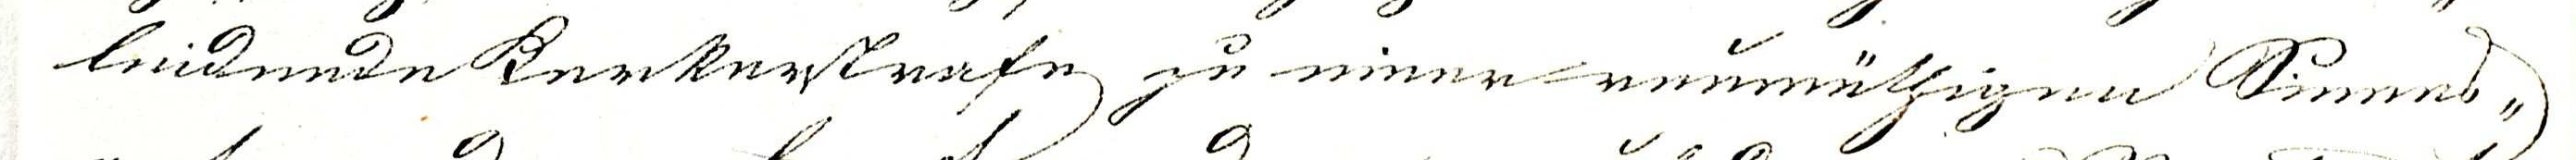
leidende Kerkerstrafe zu einer reumüthigen Sinnes¬
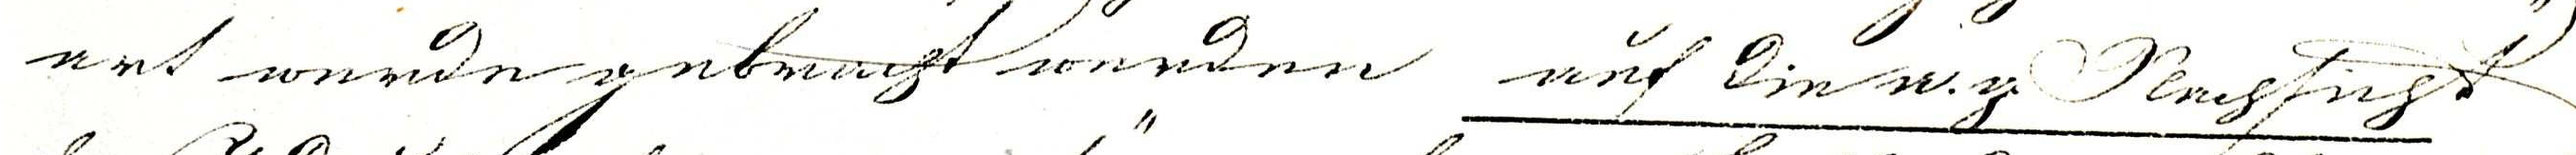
art werde gebracht werden auf die a. g. Nachsicht
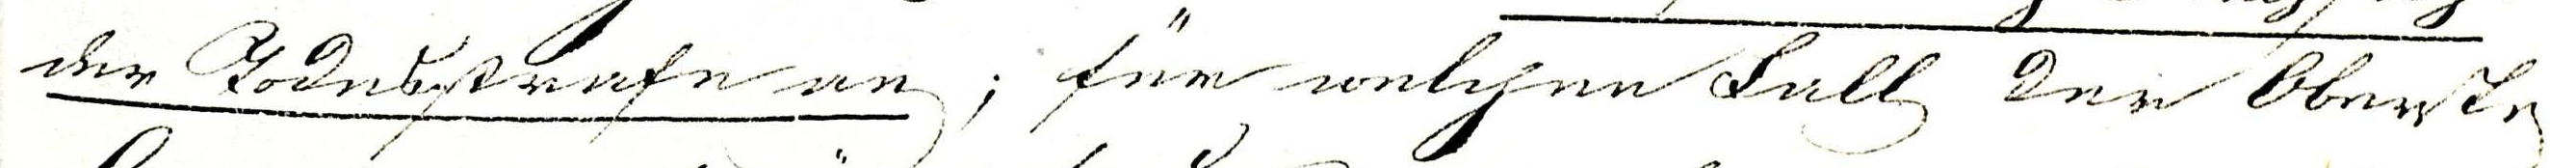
der Todesstrafe an; für welchen Fall der Oberste
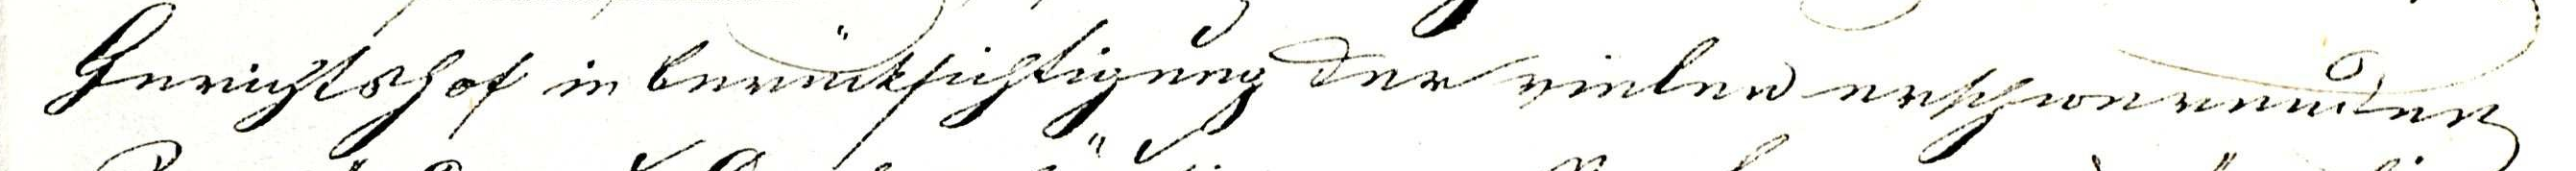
Gerichtshof in Berücksichtigung der vielen erschxx
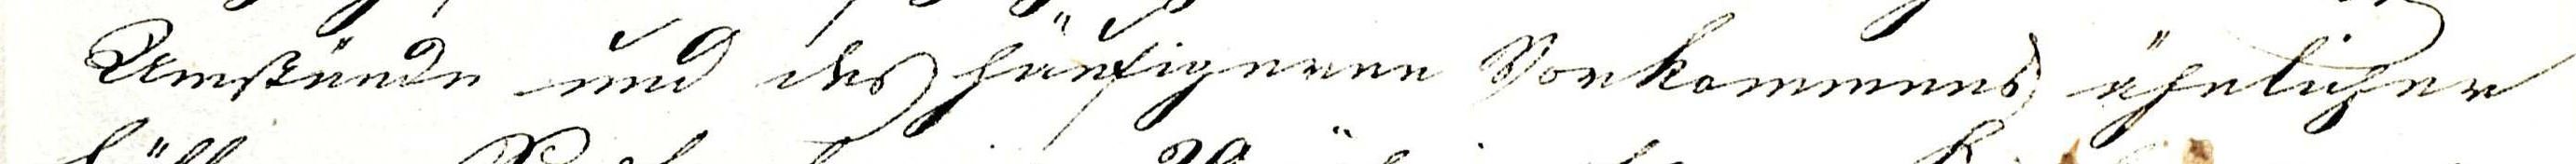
Umstände und des häufigeren Vorkommens ähnlicher
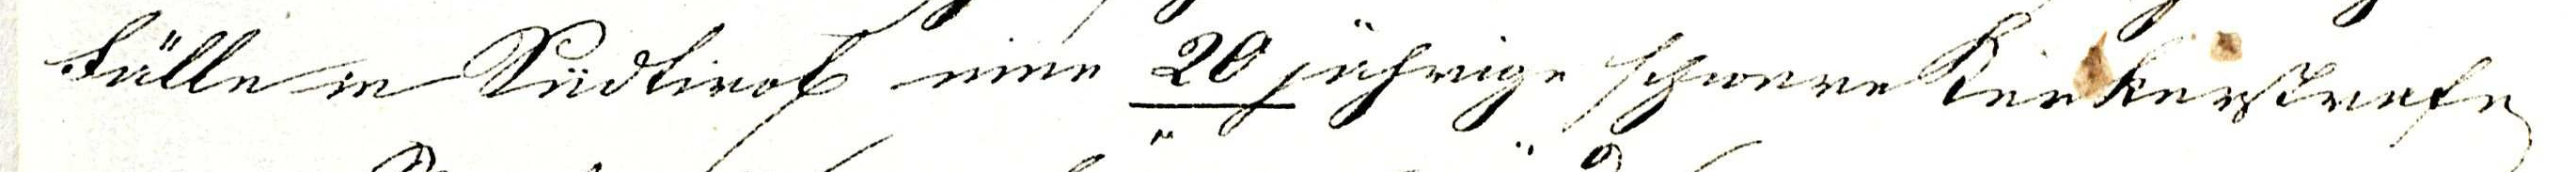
Fälle in Südtirol eine 20 jährige schwere Kerkerstrafe
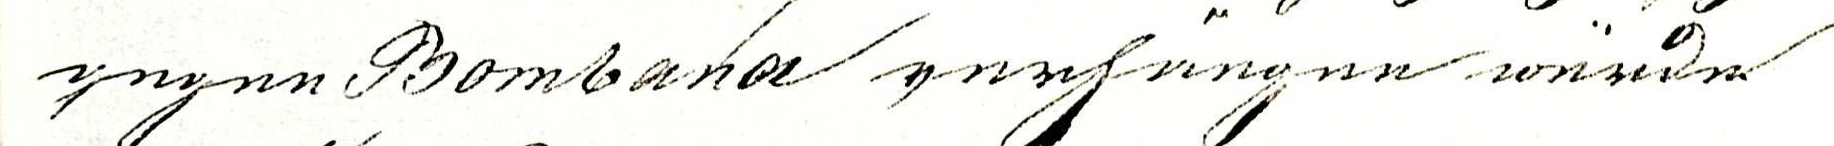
gegen Bombana verhängen würde.
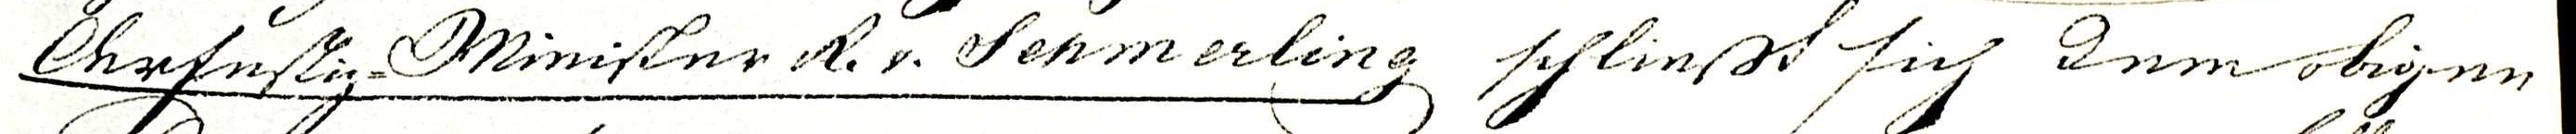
Der Justiz=Minister R. v. Schmerling schließt sich dem obigen
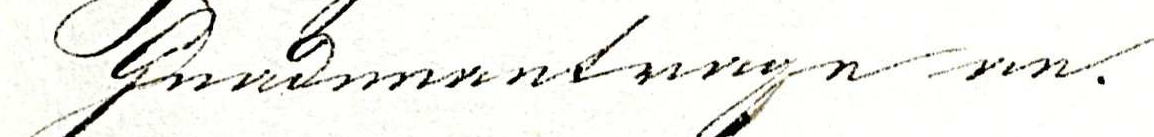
Gnadenantrage an.
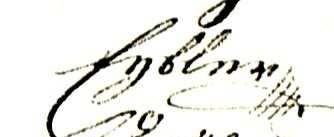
Eybler
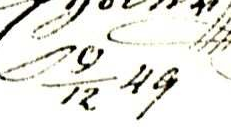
9/12 49
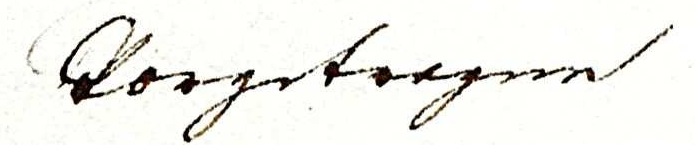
Vorgetragen
